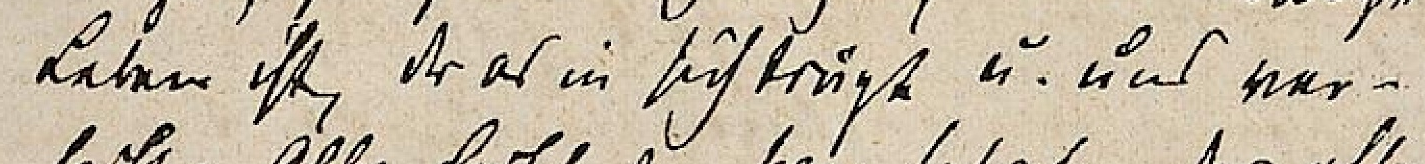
Leben ist, dr es in sich trägt u. uns ver¬
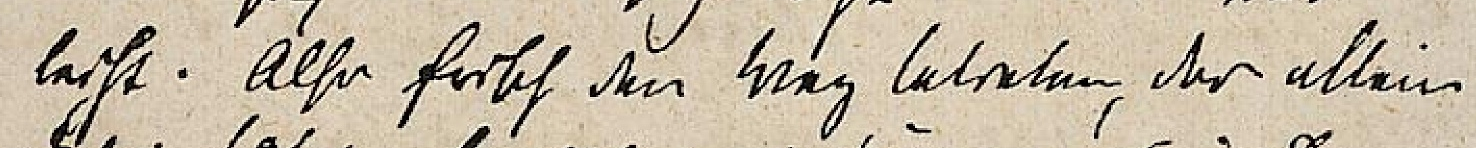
leiht. Also frisch den Weg betreten, der allein
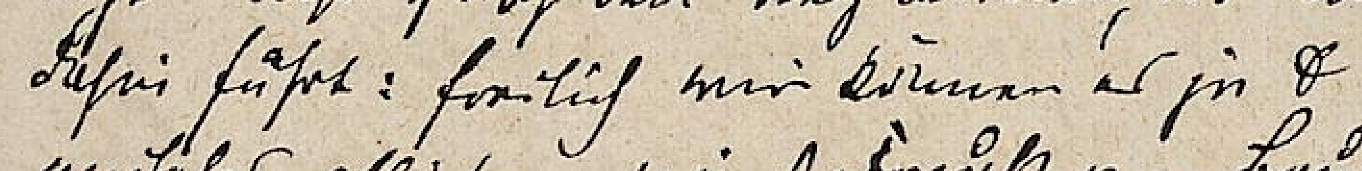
dahin führt: freilich wir können es ja o
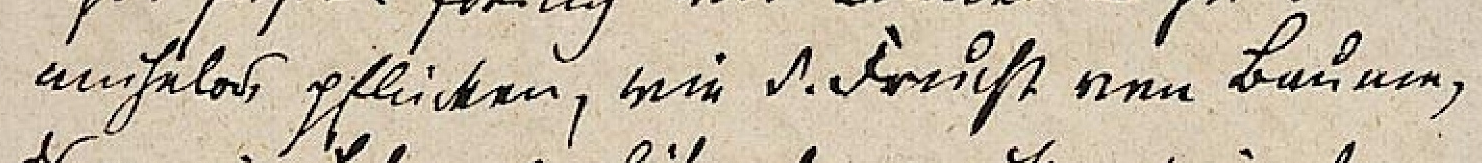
mühelos pflücken, wie d. Frucht vom Baume,
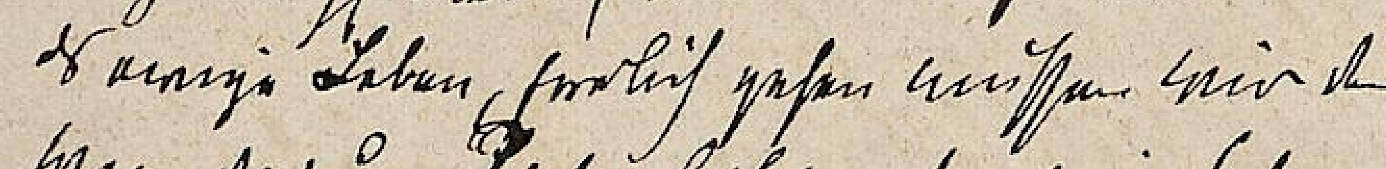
ds ewige Leben, freilich gehen müssen wir den
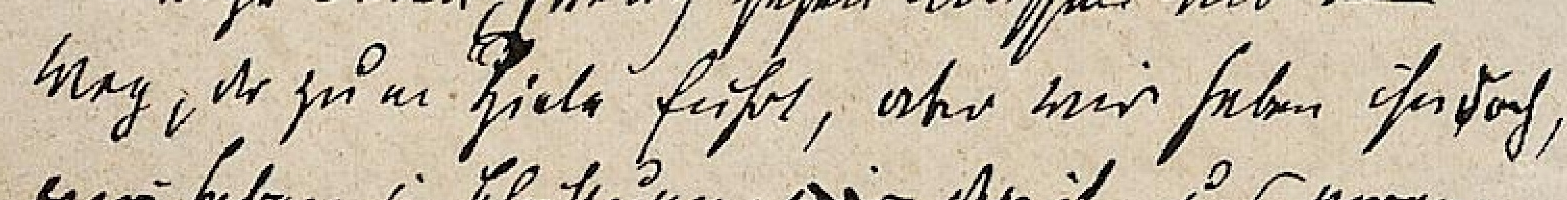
Weg, dr zum Ziele führt, aber wir haben ihn doch,
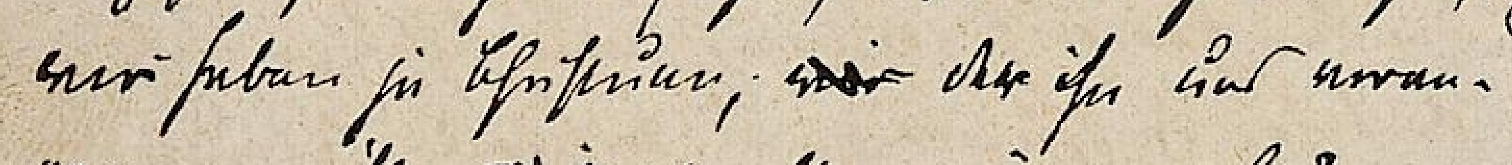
wir haben ja Christum, wir der ihn uns voran¬
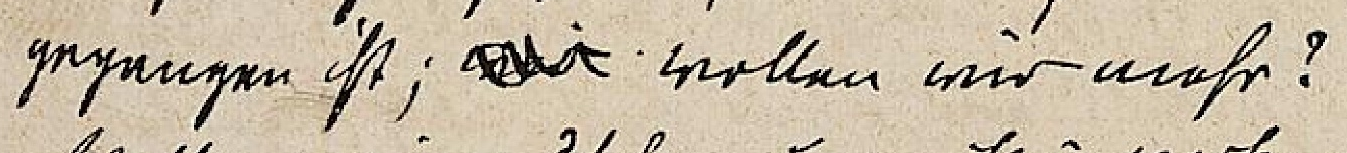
gegangen ist; wir wollen wir mehr?
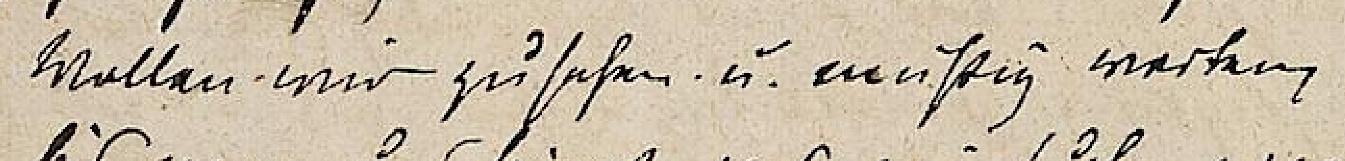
Wollen wir zusehen u. müßig warten,
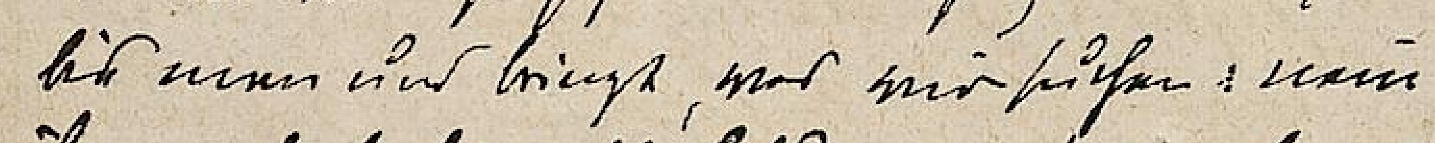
bis man uns bringt, was wir suchen: nein
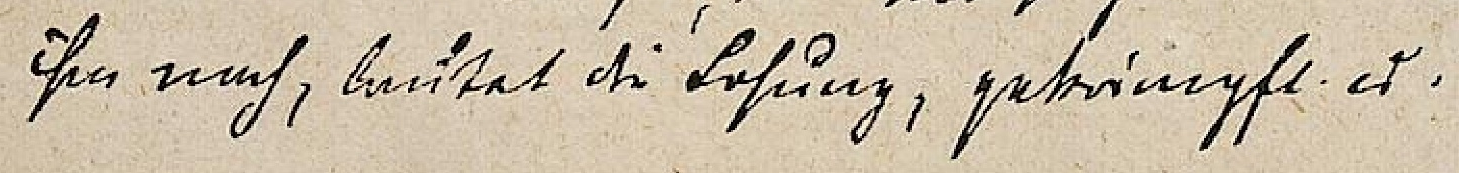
ihm nach, lautet die Losung, gekämpft u.
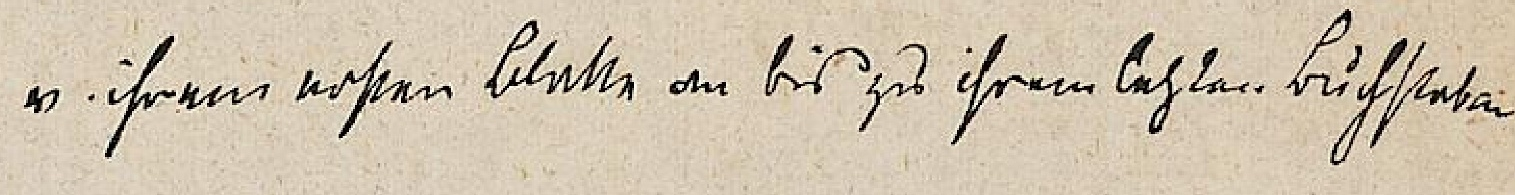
v ihrem ersten Blatte an bis zu ihrem letzten Buchstaben
